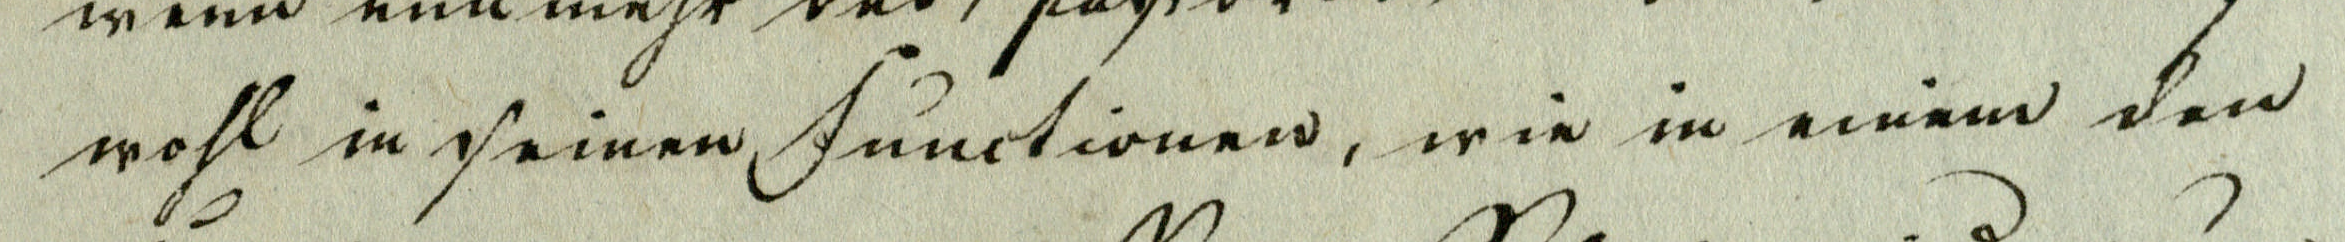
wohl in seinen Functionen, wie in einem den
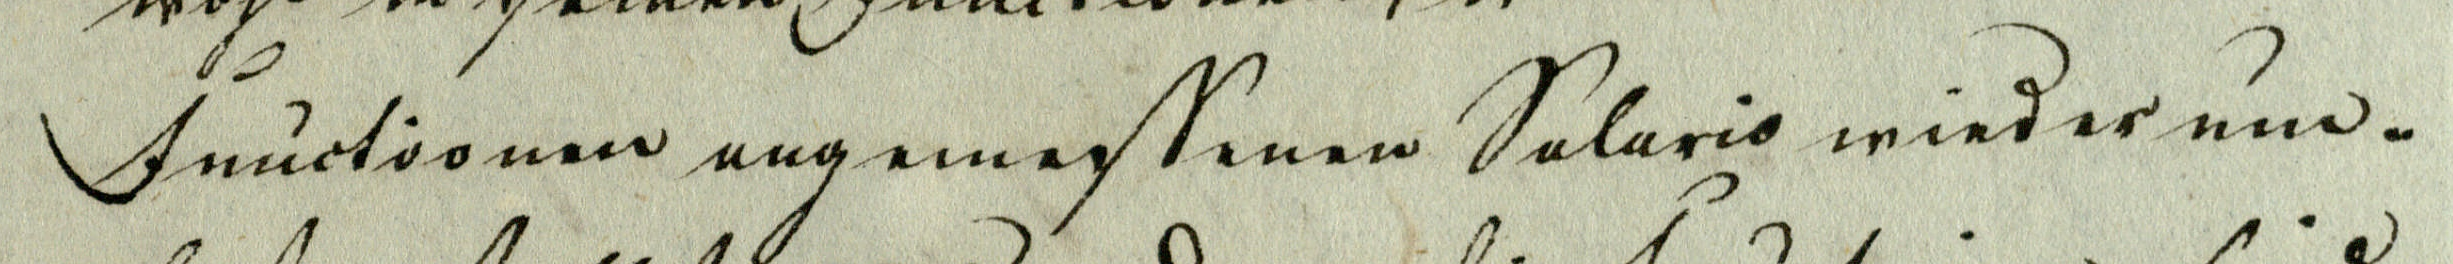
Functionen angemessenen Salario wiederum
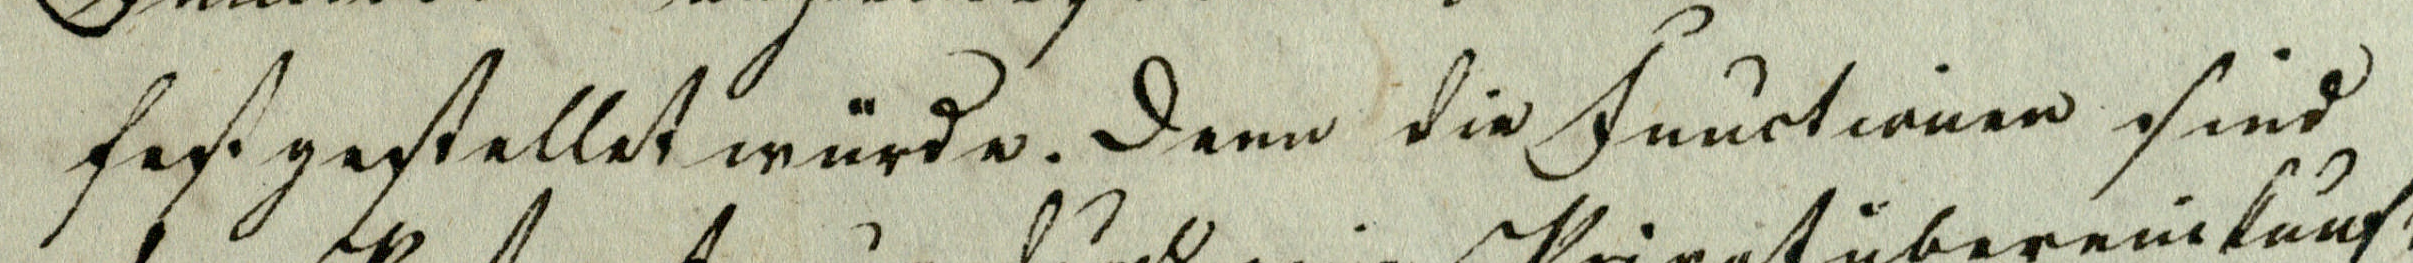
festgestellet würde. Denn die Functionen sind
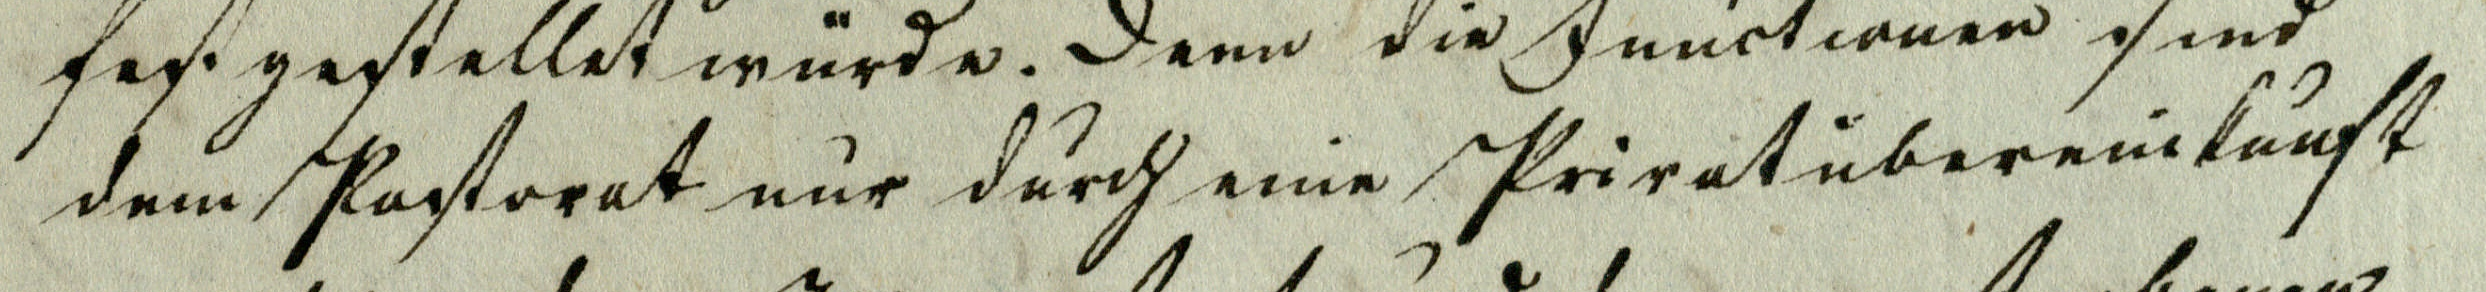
dem Pastorat nur durch eine Privatübereinkunft
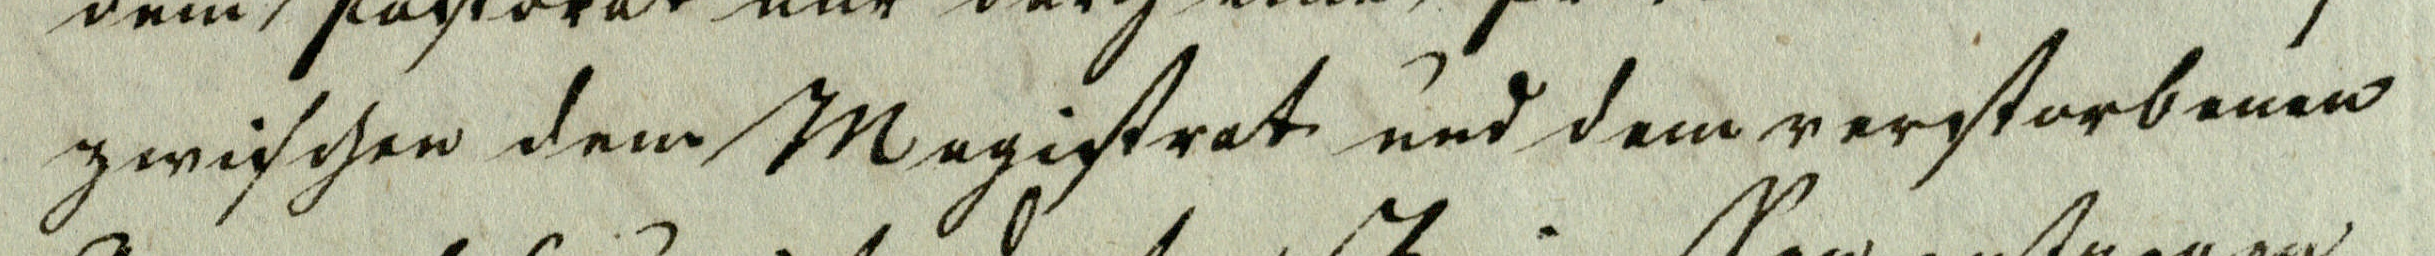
zwischen dem Magistrat und dem verstorbenen
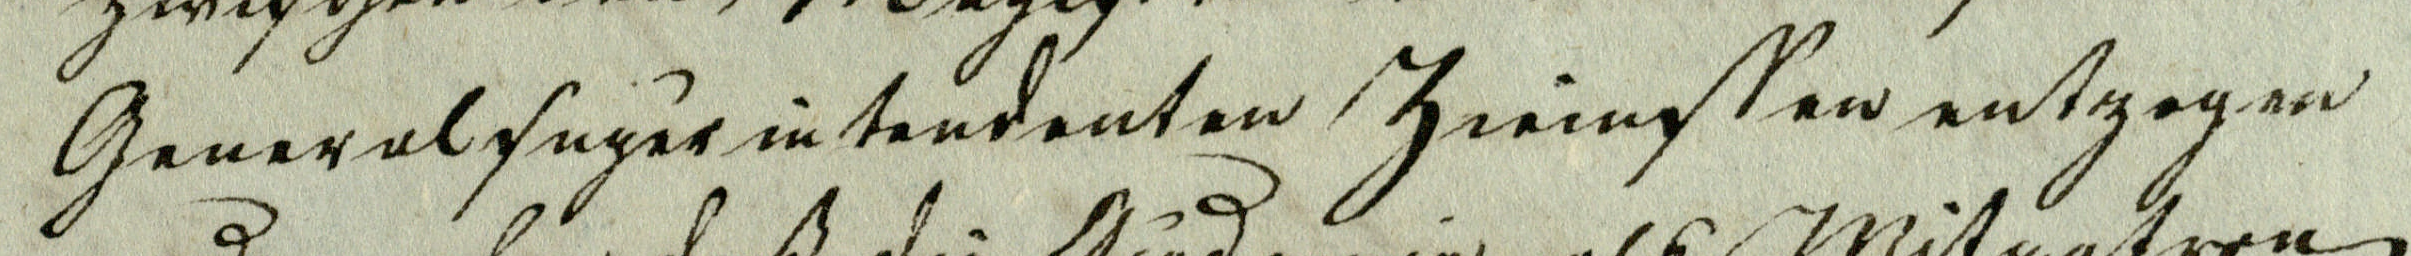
Generalsuperintendenten Ziemssen entzogen
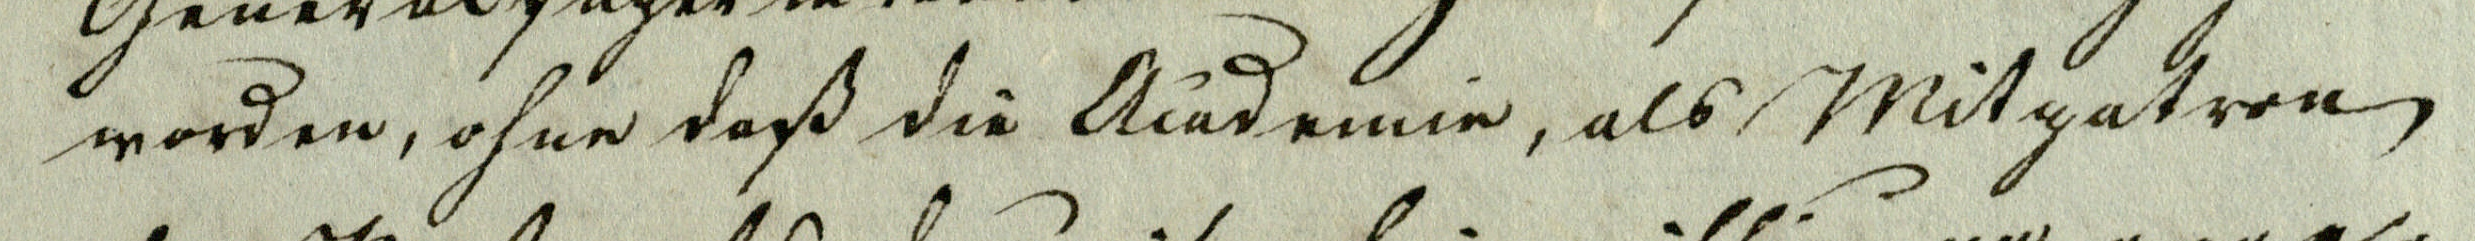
worden, ohne daß die Academie, als Mitpatron
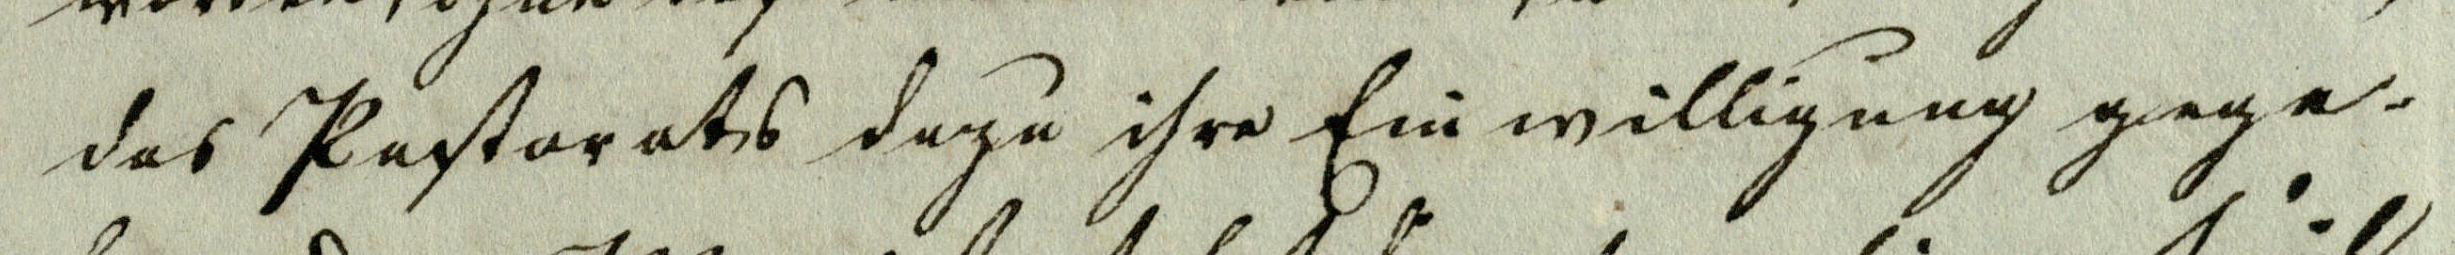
des Pastorats dazu ihre Einwiligung gege¬
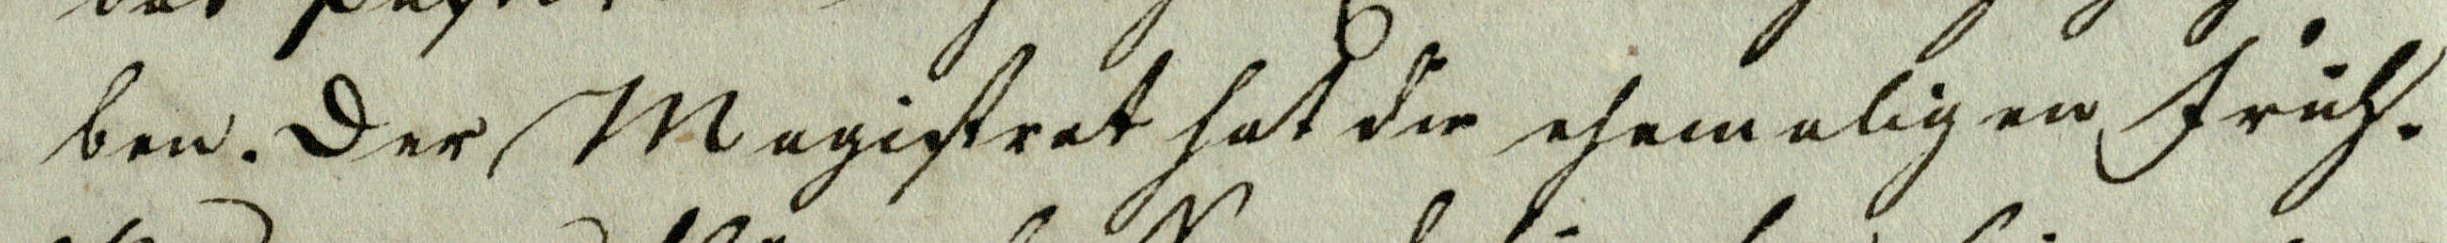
ben. Der Magistrat hat die ehemaligen Früh¬
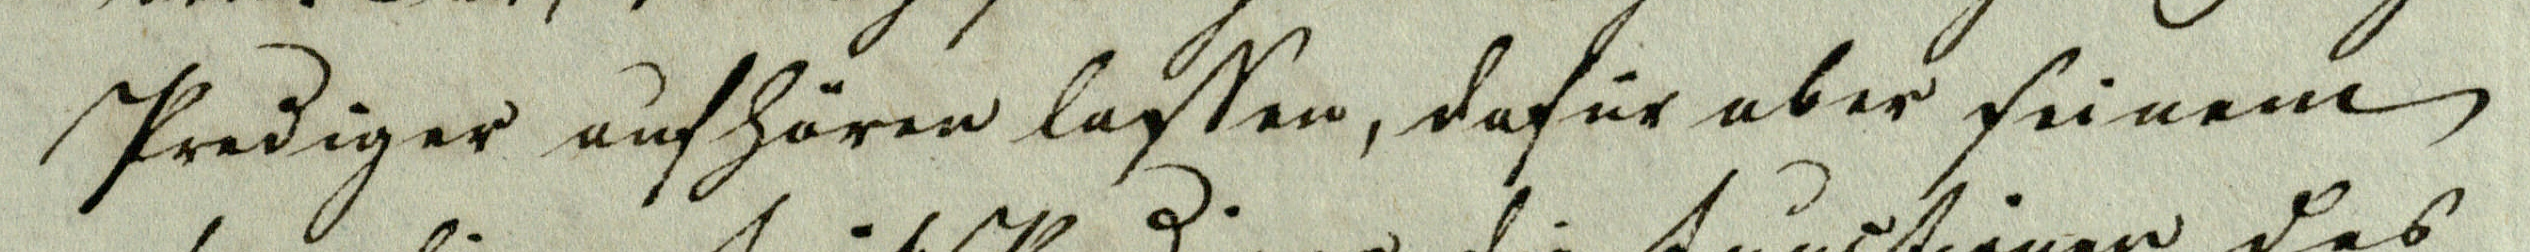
Prediger aufhören lassen, dafür aber seinem
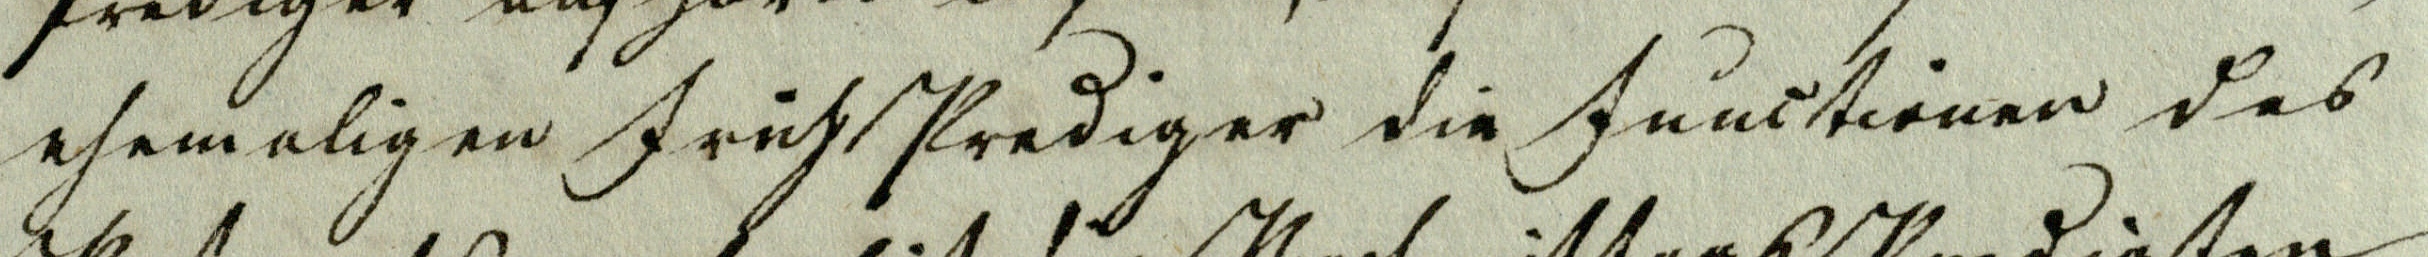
ehemaligen Früh Prediger die Functionen des
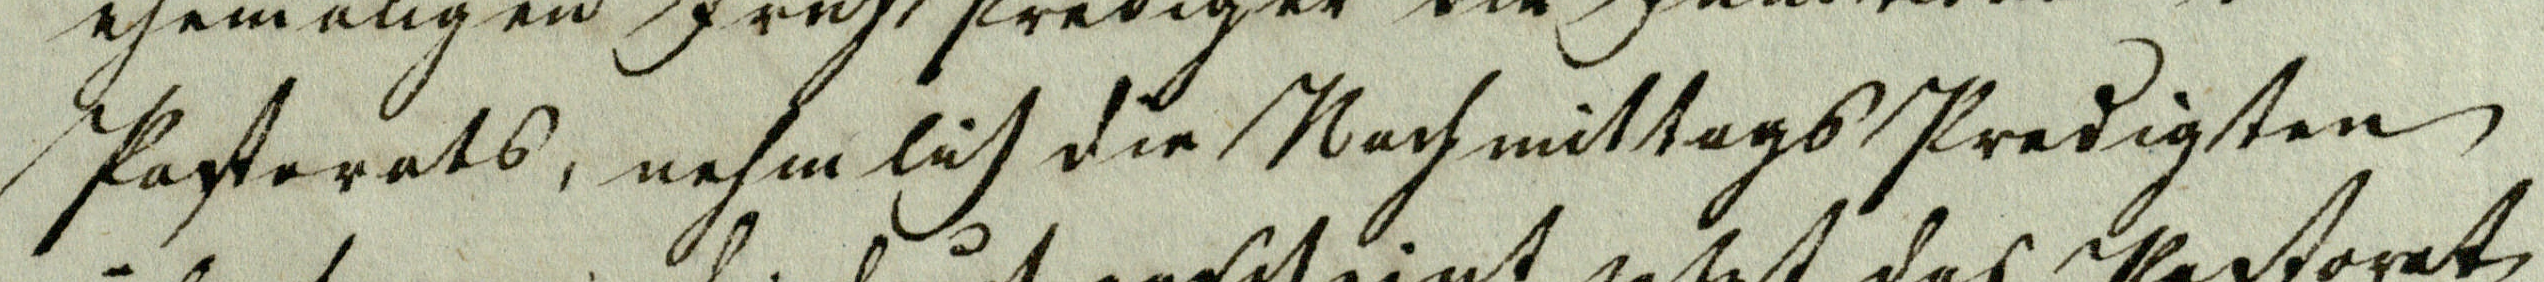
Pastorats, nehmlich die Nachmittags Predigten
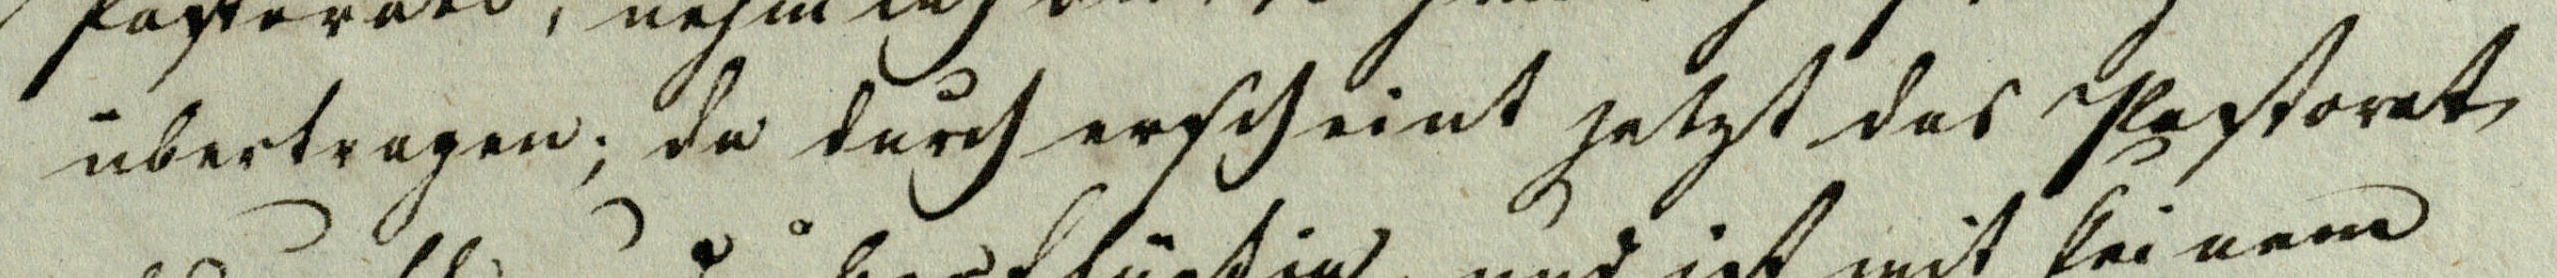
übertragen, da durch erscheint jetzt das Pastorat
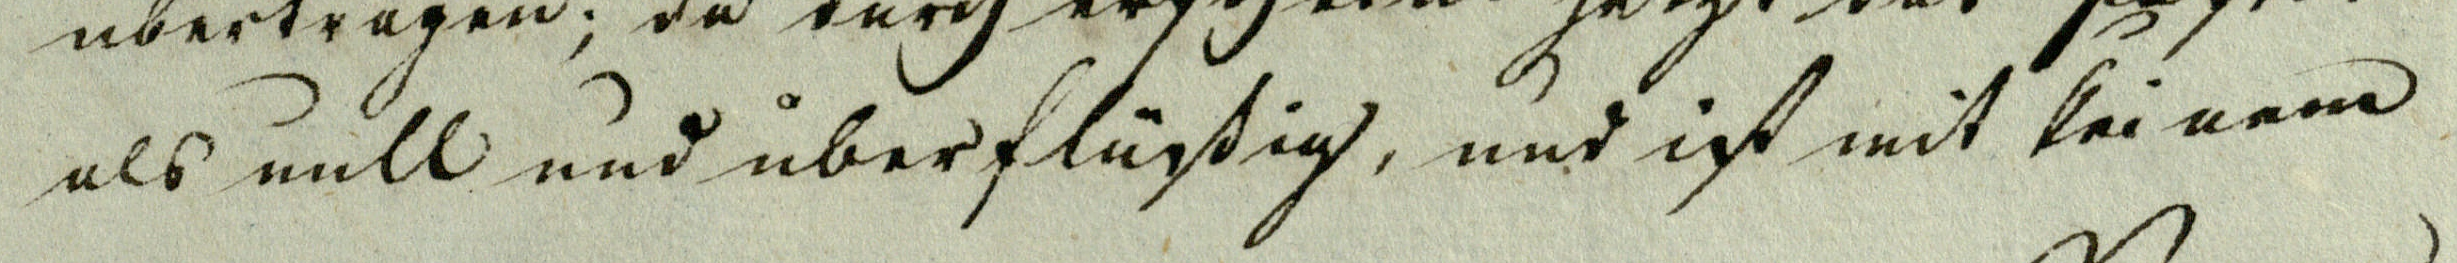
als null und überflüssig, und ist mit keinem
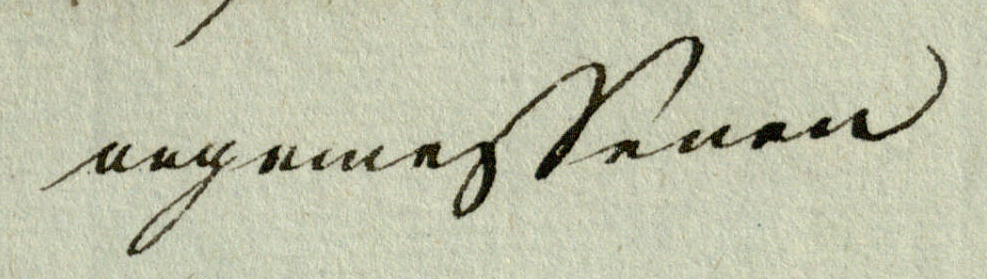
angemessenen
